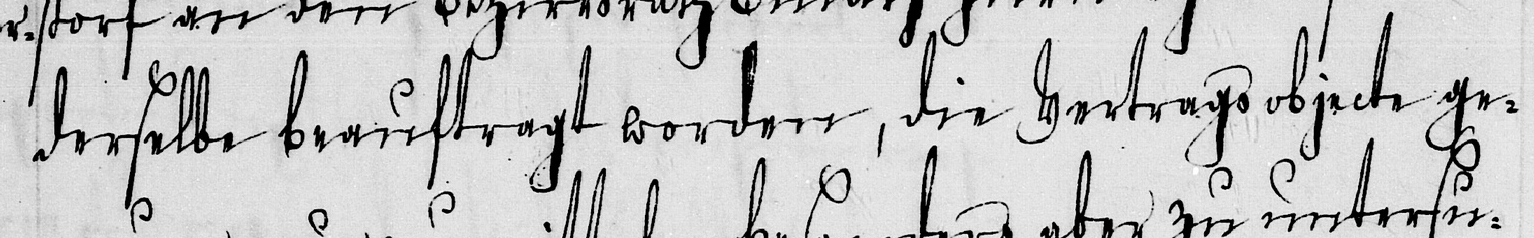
derselbe beauftragt worden, die Vertragsobjecte ge¬
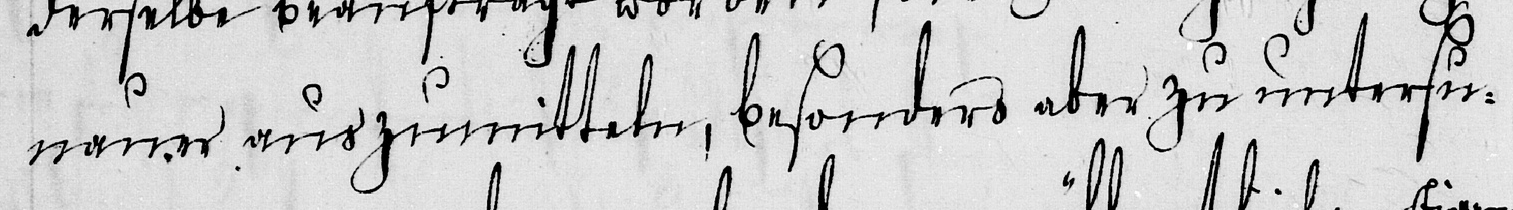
nauer auszumitteln, besonders aber zu untersu¬
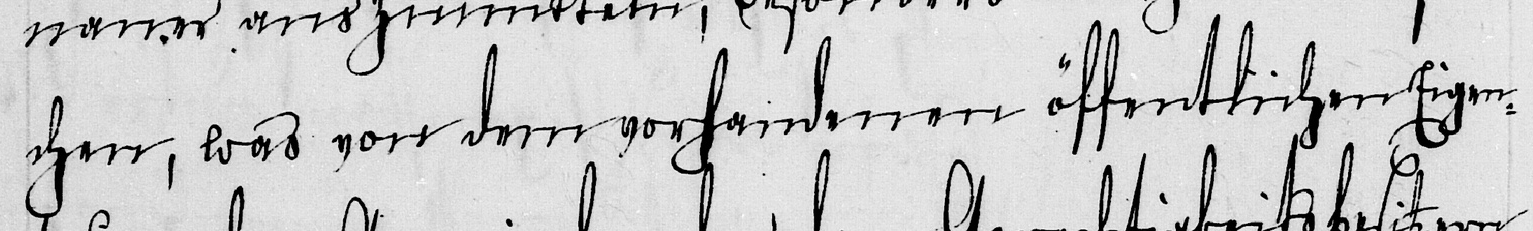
chen, was von dem vorhandenen öffentlichen Eigen¬
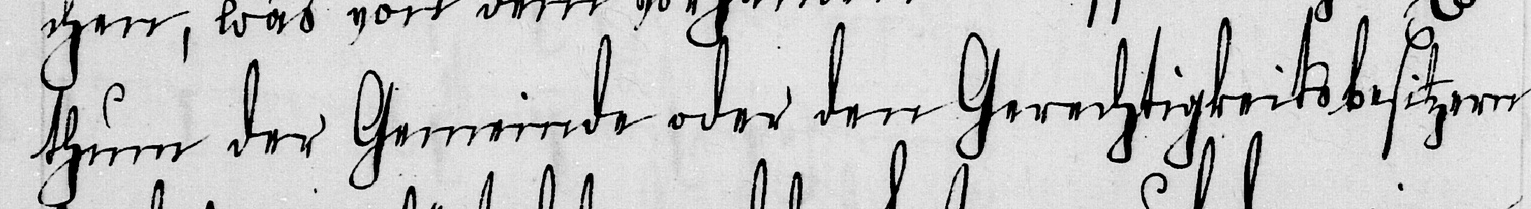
thum der Gemeinde oder den Gerechtigkeitsbesitzern
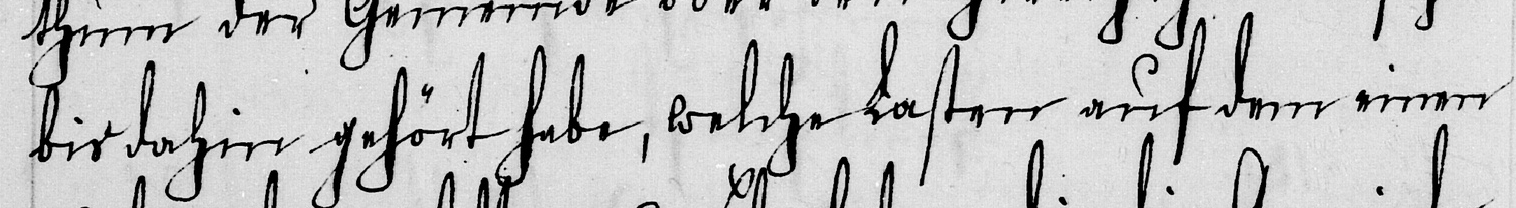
bis dahin gehört habe, welche Lasten auf dem einen
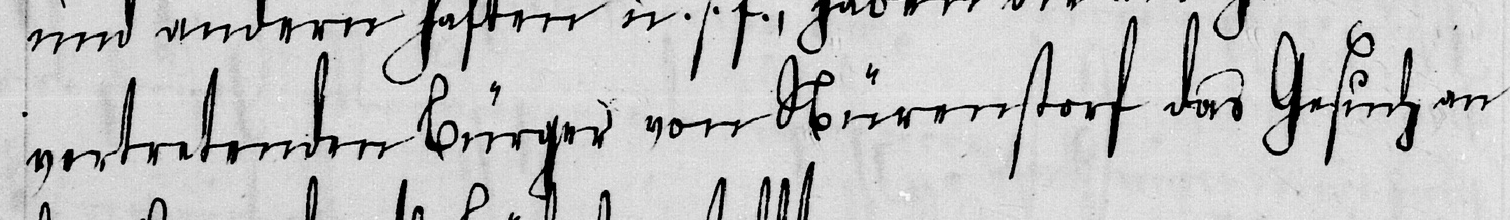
vertretenden Bürger von Nürenstorf das Gesuch an
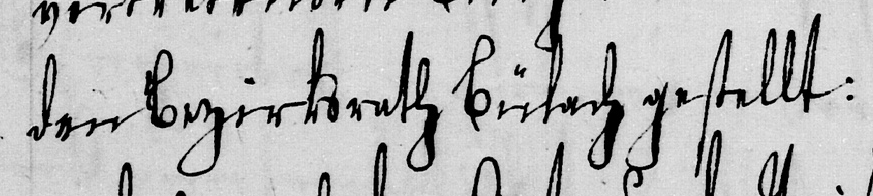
den Bezirksrath Bülach gestellt:
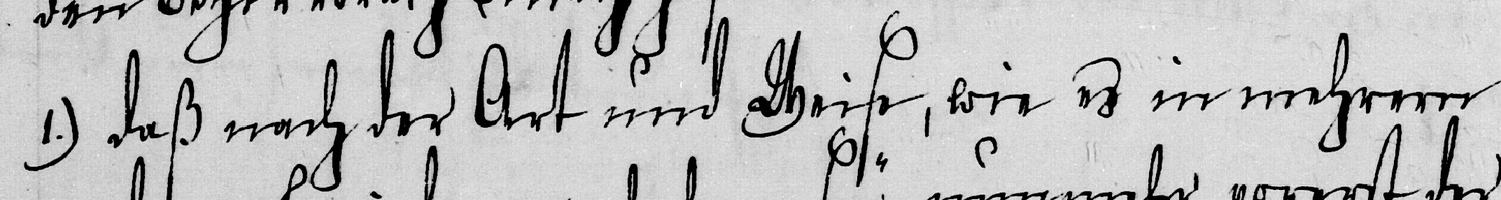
1.) daß nach der Art und Weise, wie es in mehrern
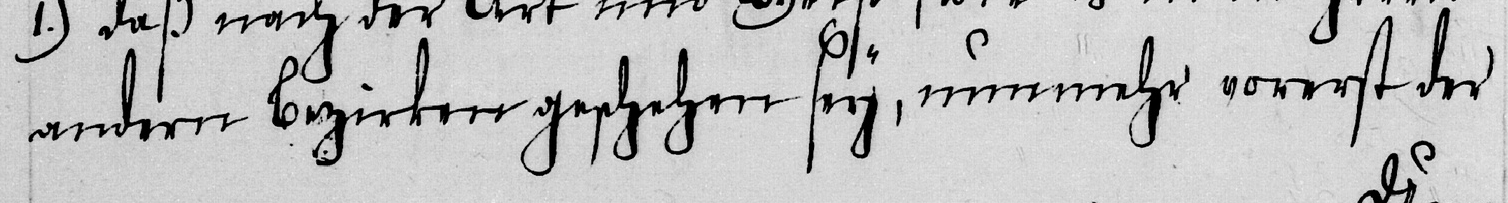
andern Bezirken geschehen sey, nunmehr vorerst der
